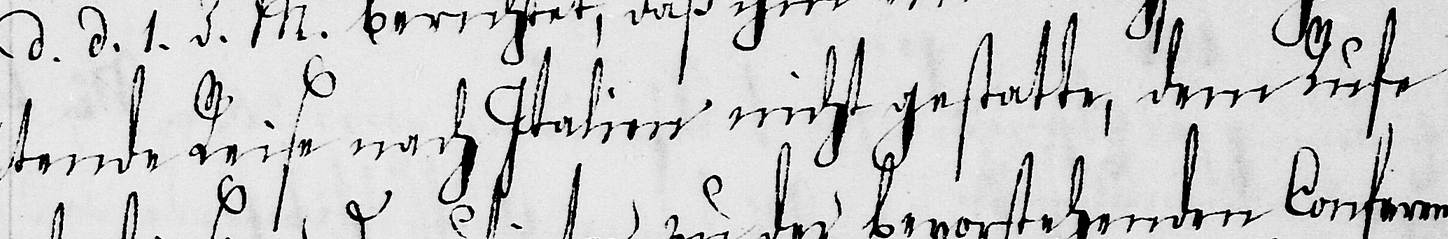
tende Reise nach Italien nicht gestatte, dem Rufe
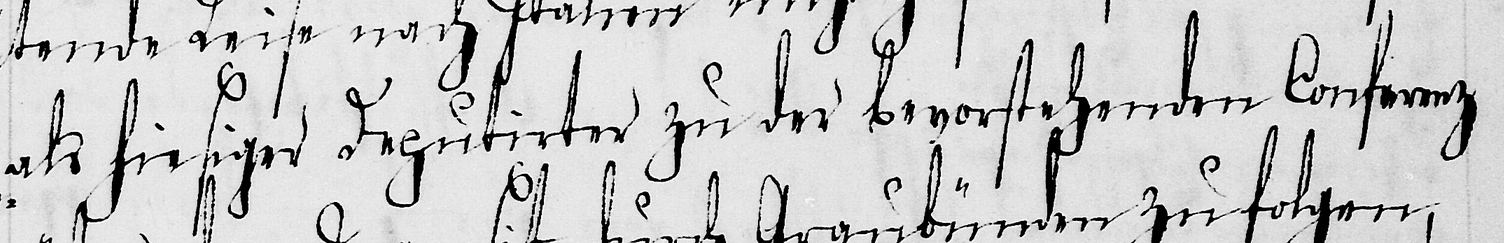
als hiesiger Deputirter zu der bevorstehenden Conferenz
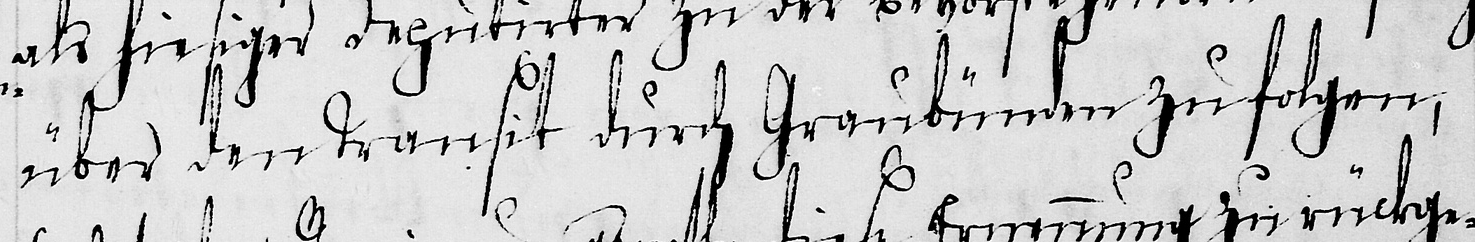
über den Transit durch Graubünden zu folgen,
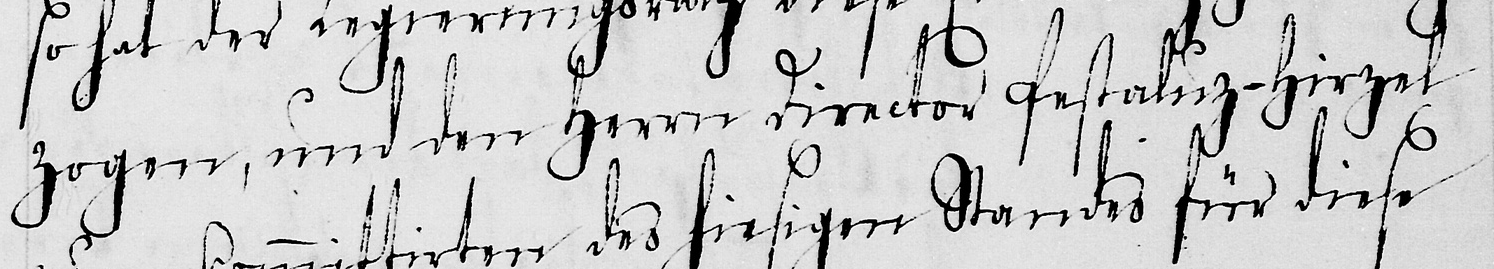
ezogen, und den Herrn Director Pestaluz-Hirzel
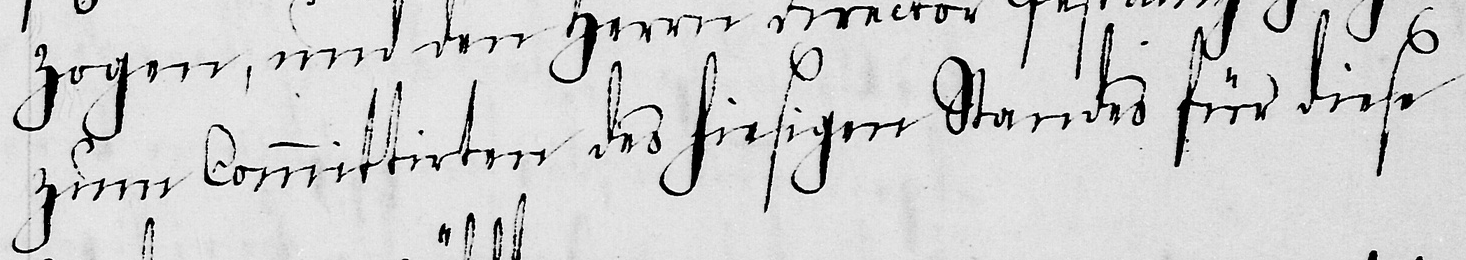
zum Committirten des hiesigen Standes für diese
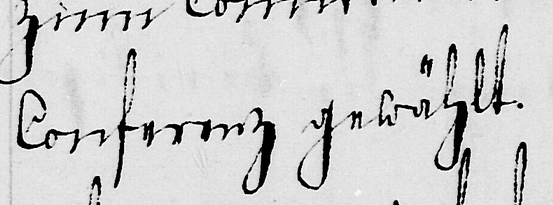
Conferenz gewählt.
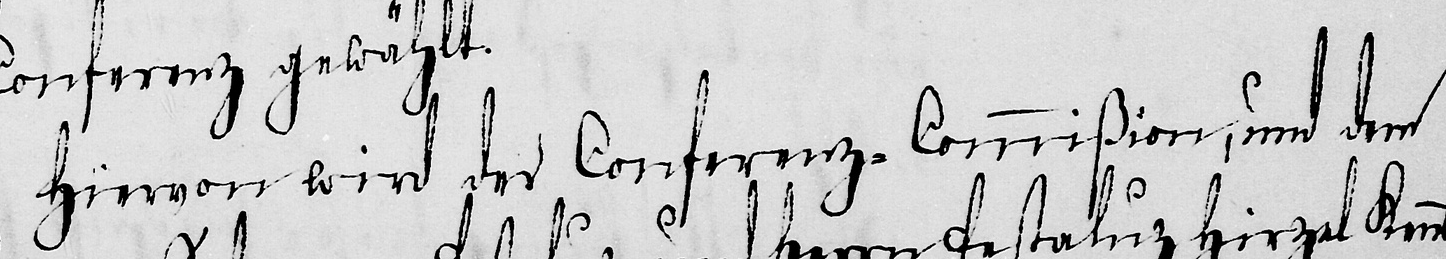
Hiervon wird der Conferenz-Commißion, und dem
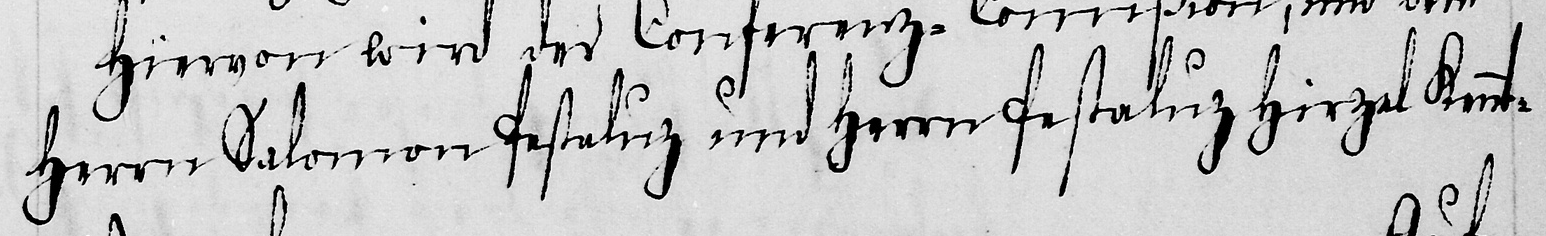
Herrn Salomon Pestaluz und Herrn Pestaluz Hirzel Kenn¬
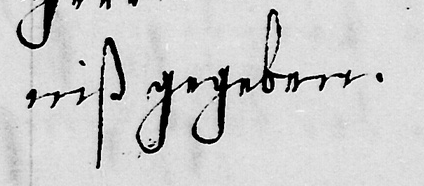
tniß gegeben.
